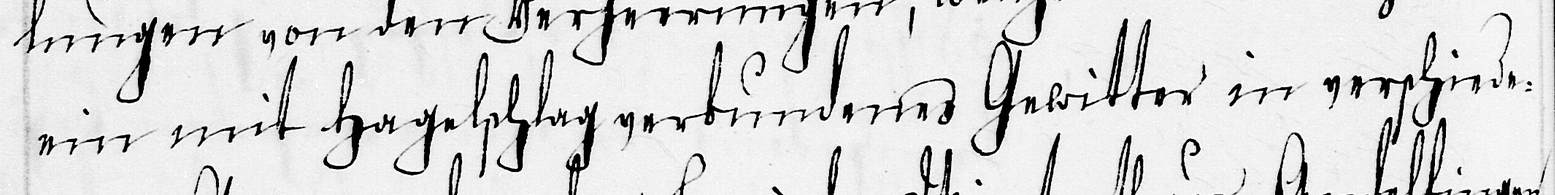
ein mit Hagelschlag verbundenes Gewitter in verschied¬
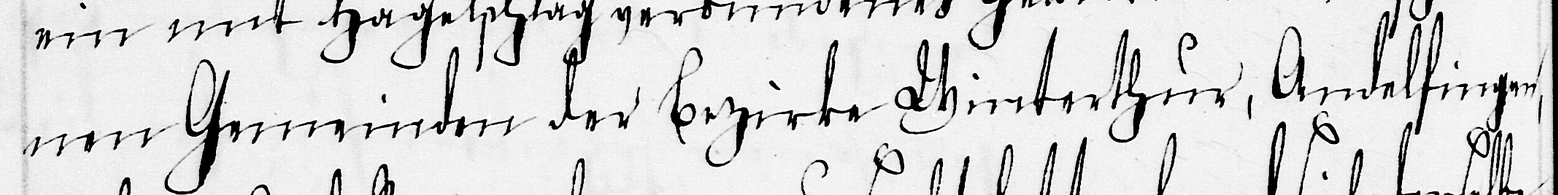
enen Gemeinden der Bezirke Winterthur, Andelfinge¬
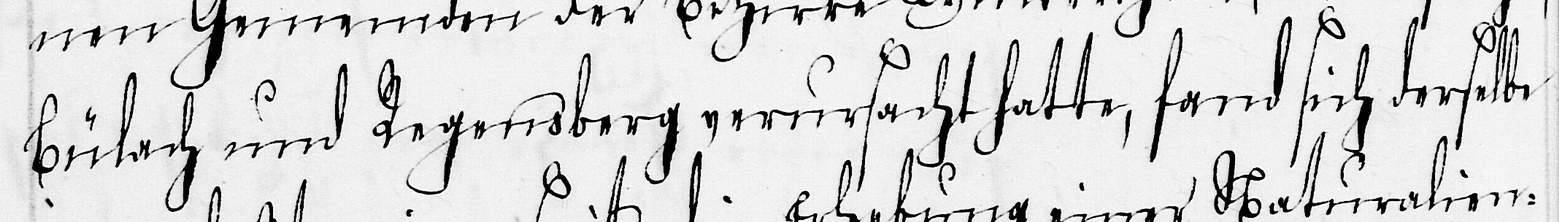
Bülach und Regensberg verursacht hatte, fand sich dersel¬
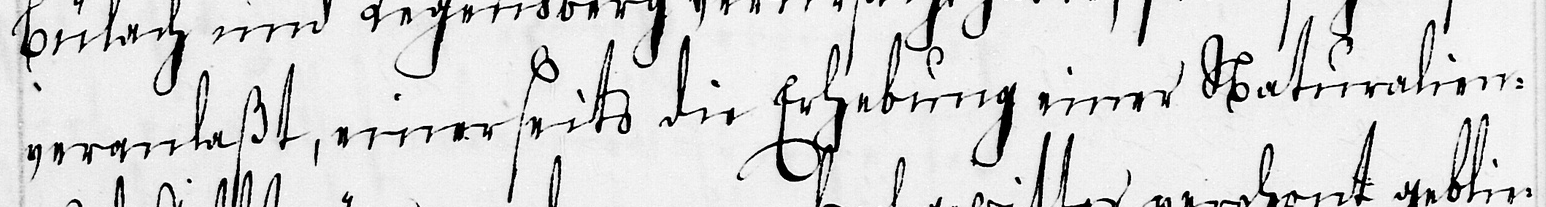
veranlaßt, einerseits die Erhebung einer Naturalien-
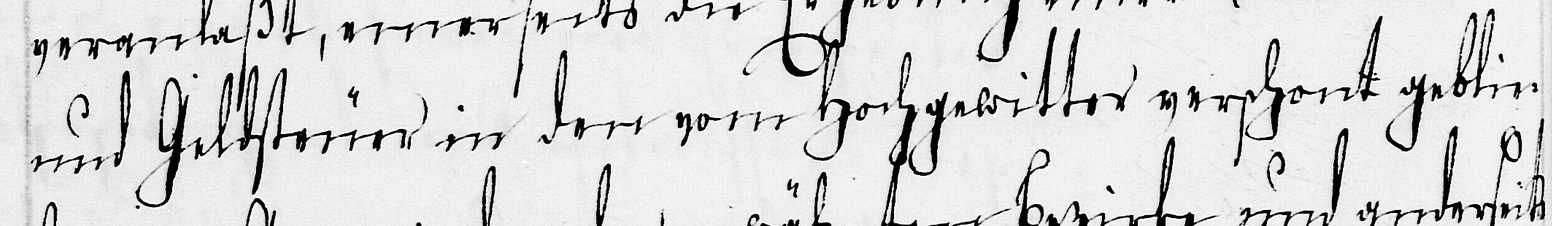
und Geldsteuer in den vom Hochgewitter verschont geblie¬
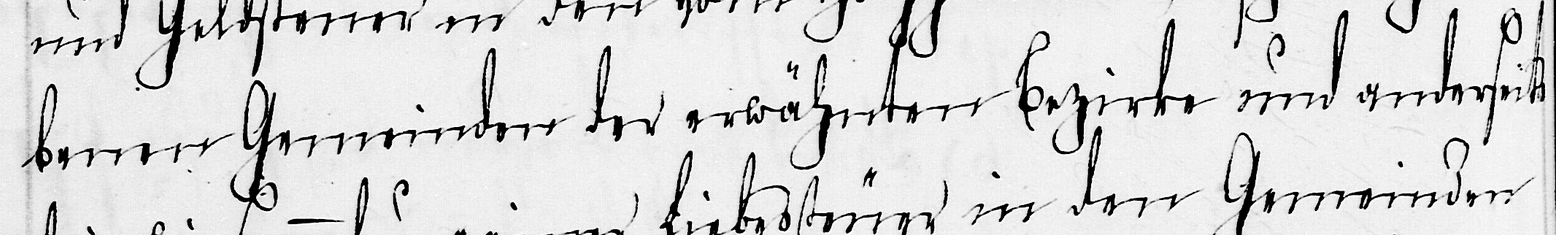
benen Gemeinden der erwähnten Bezirke und andersei¬
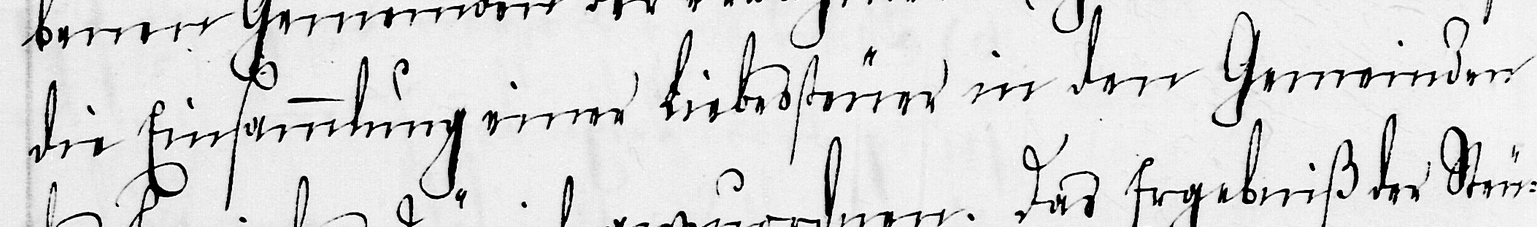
die Einsammlung einer Liebessteuer in den Gemeinden
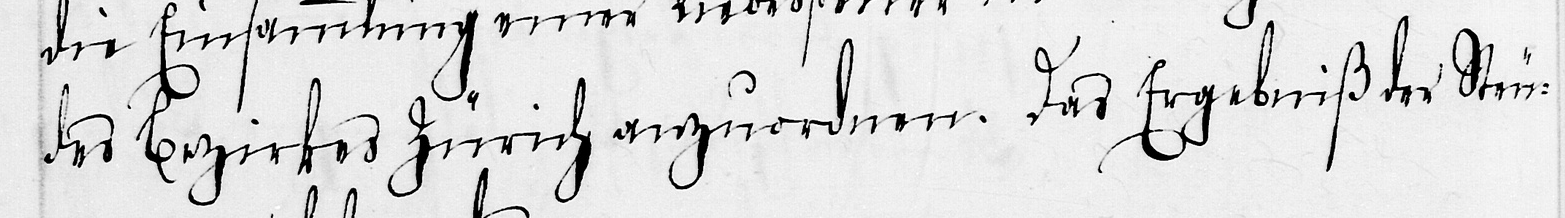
des Bezirkes Zürich anzuordnen. Das Ergebniß der Steu¬
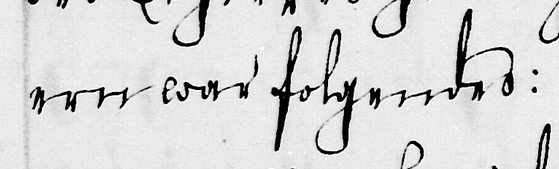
ern war folgendes:
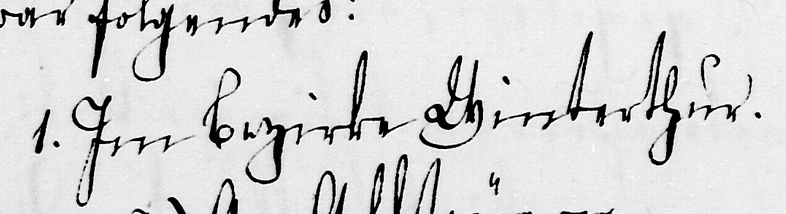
1. Im Bezirke Winterthur.
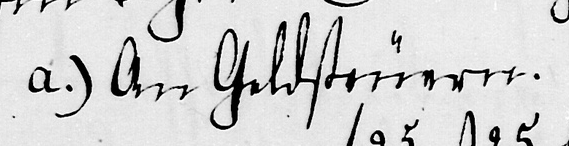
a.) An Geldsteuern.
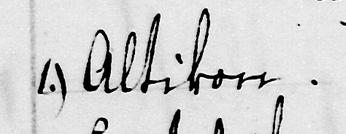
1.) Altikon
